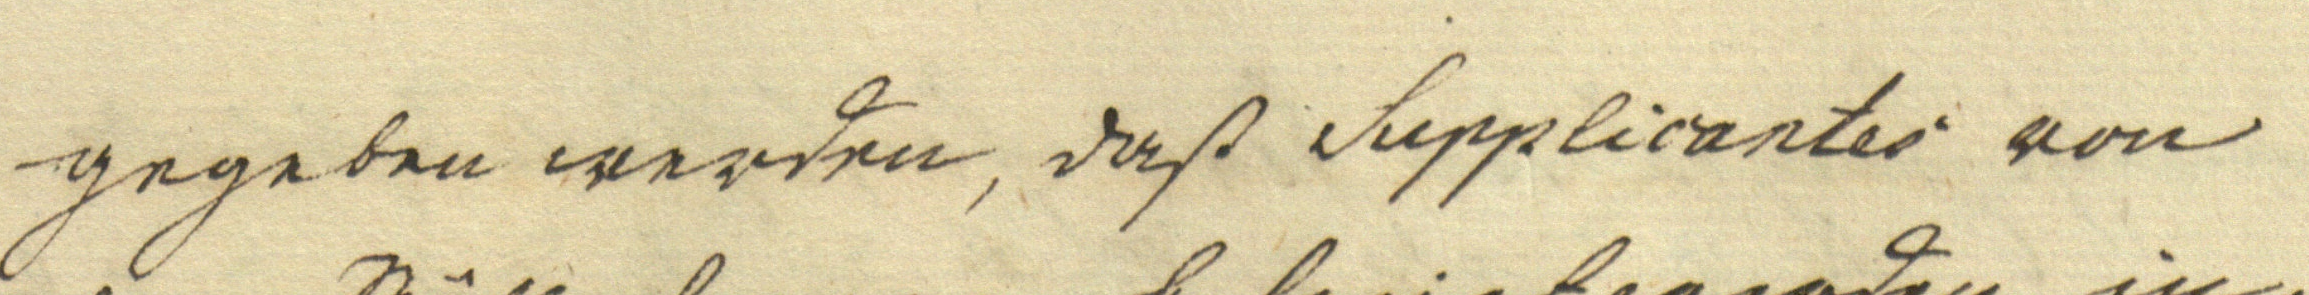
gegeben werden, daß Supplicantes von
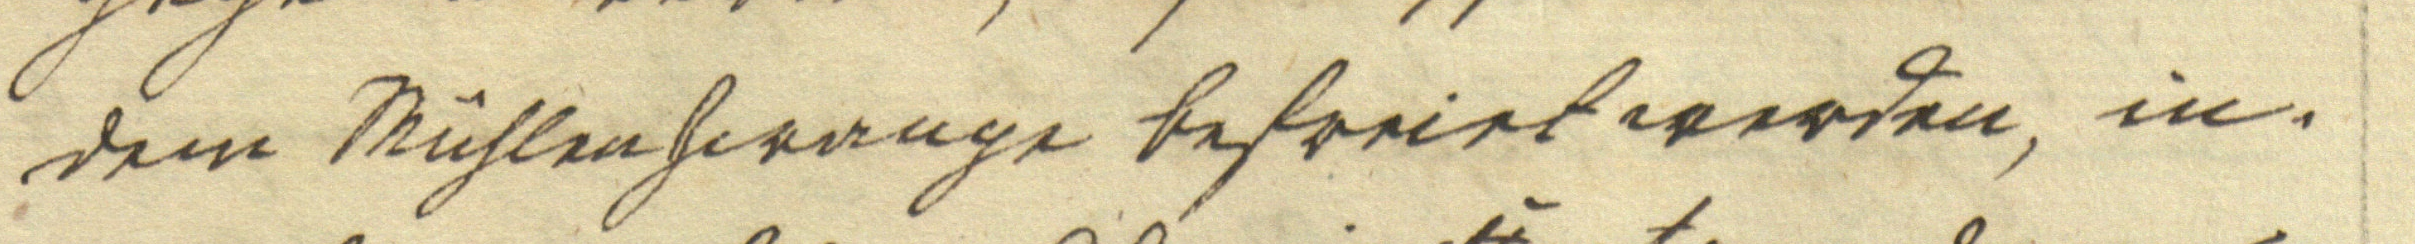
dem Mühlenzwange befreiet werden, in¬
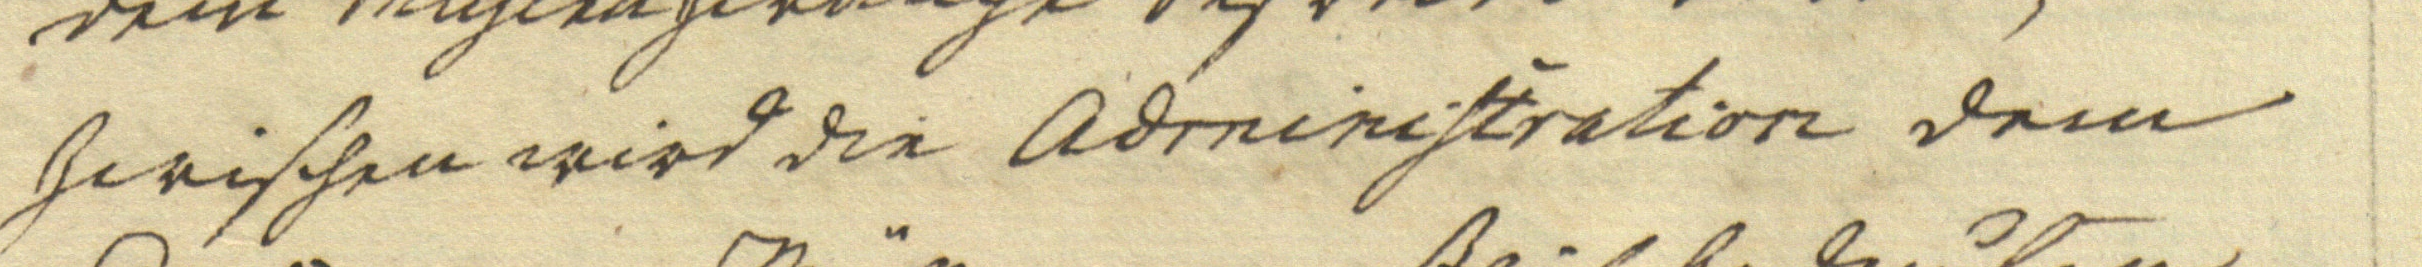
zwischen wird die Administration dem
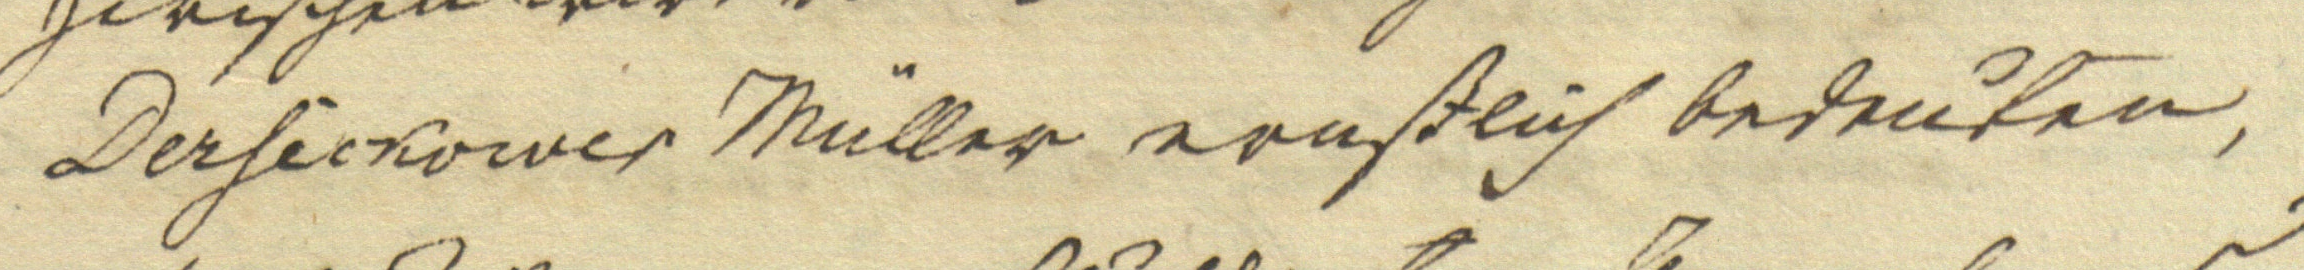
Derseckower Müller ernstlich bedeuten,
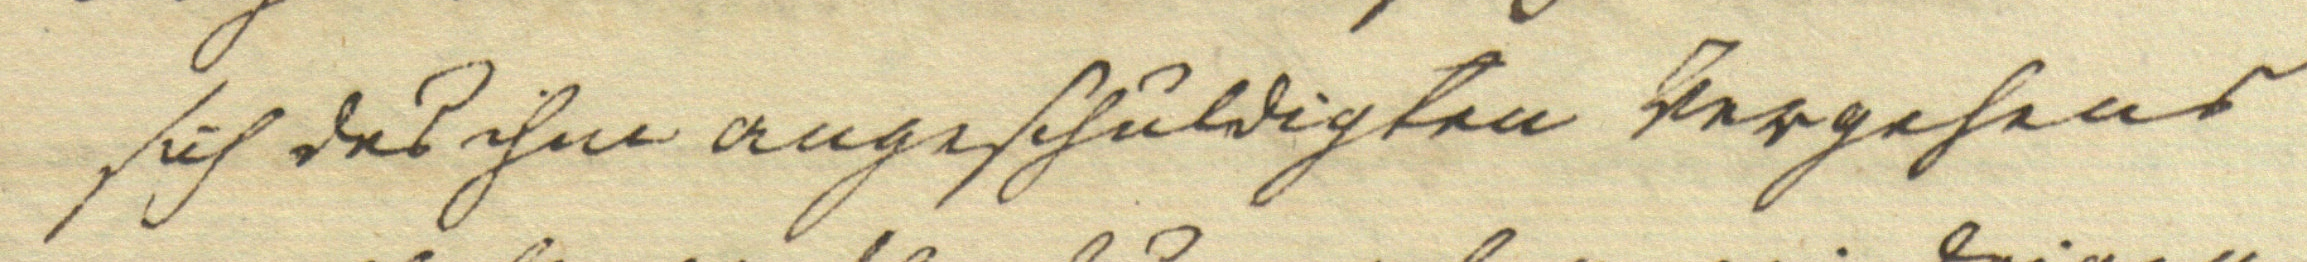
sich des ihm angeschuldigten Vergehens
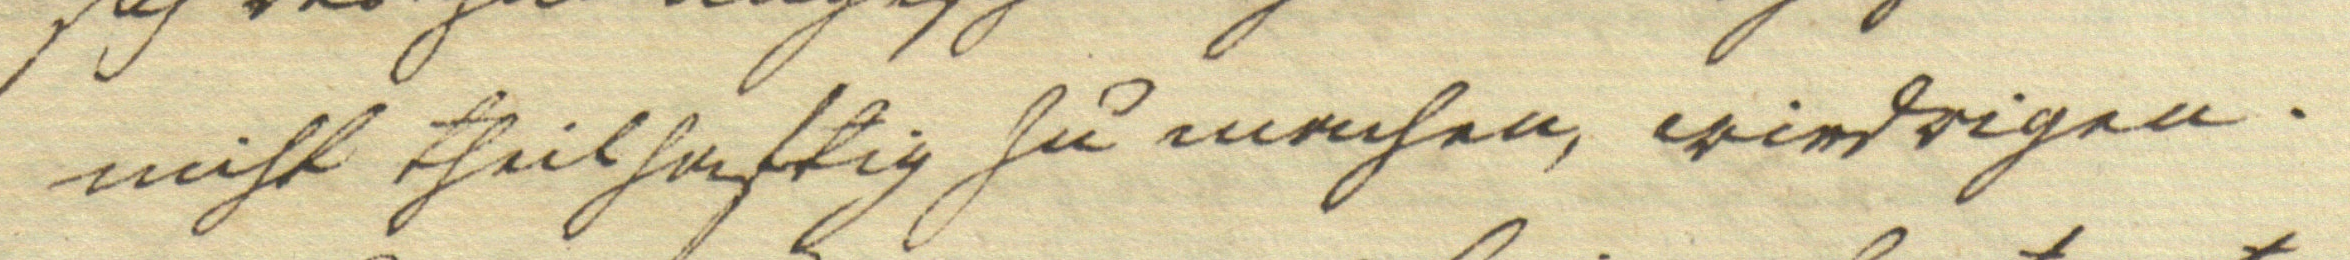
nicht theilhaftig zu machen, wiedrigen¬
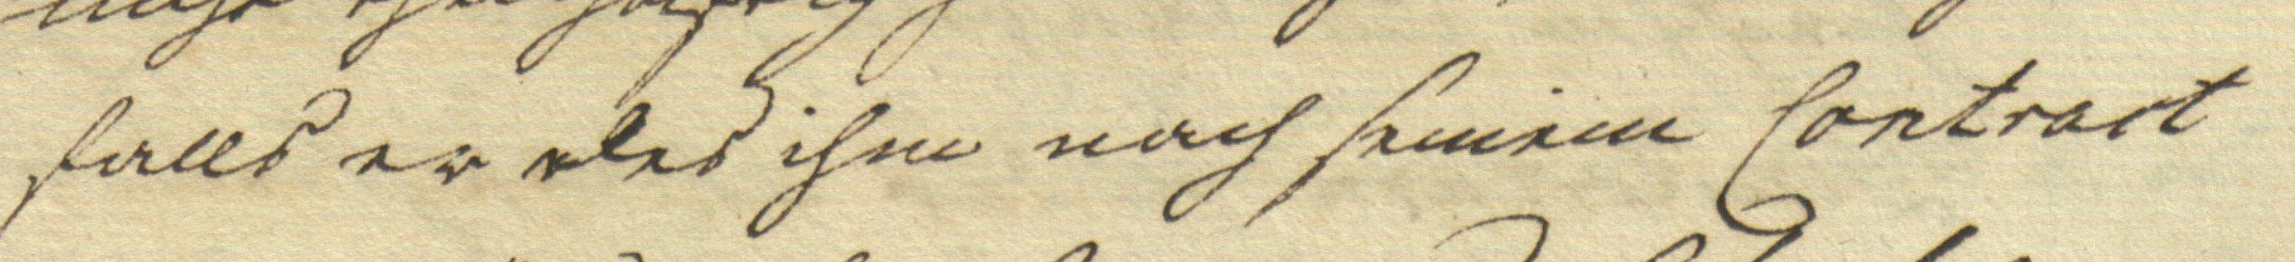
falls er des ihm nach seinem Contract
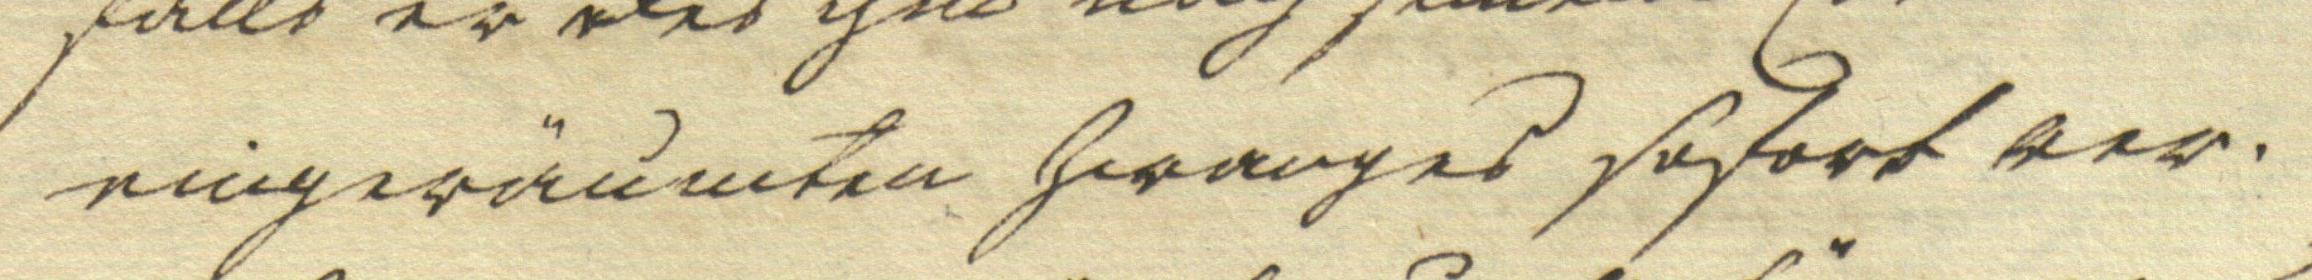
eingeräumten Zwanges sofort ver¬
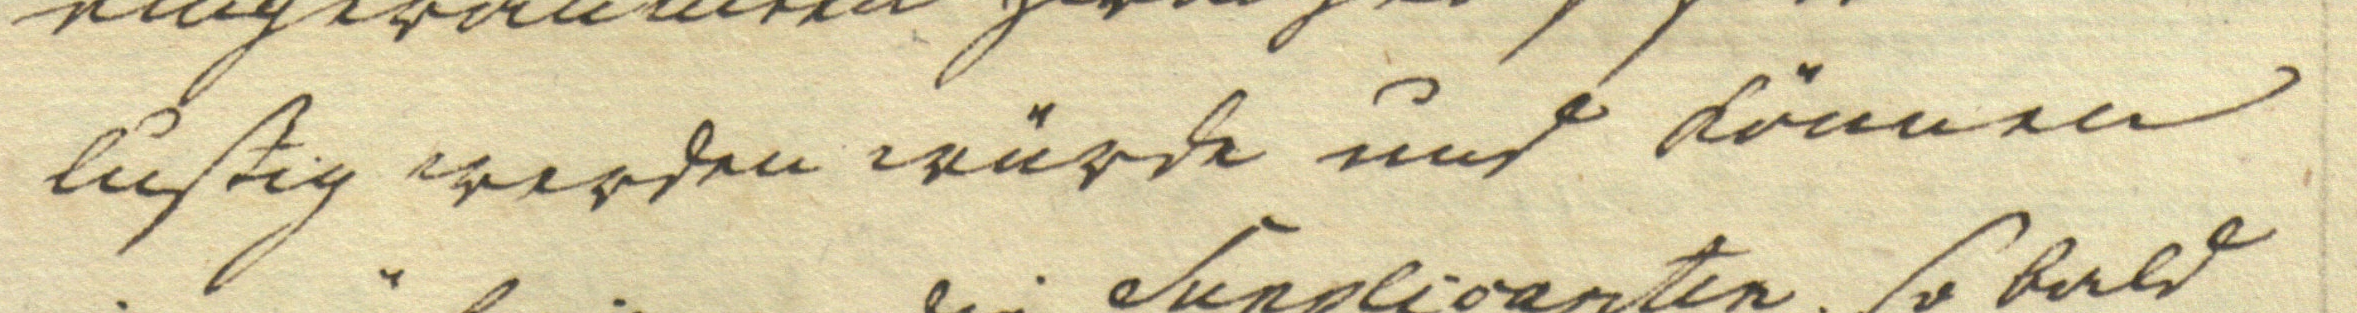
lustig werden würde und können
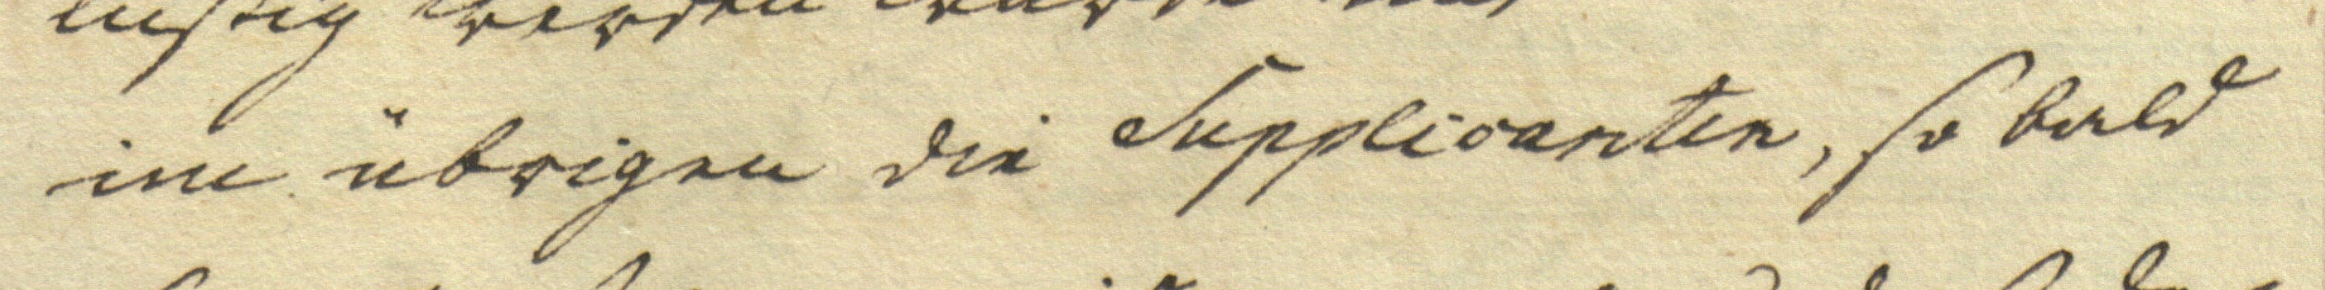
im übrigen die Supplicanten, so bald
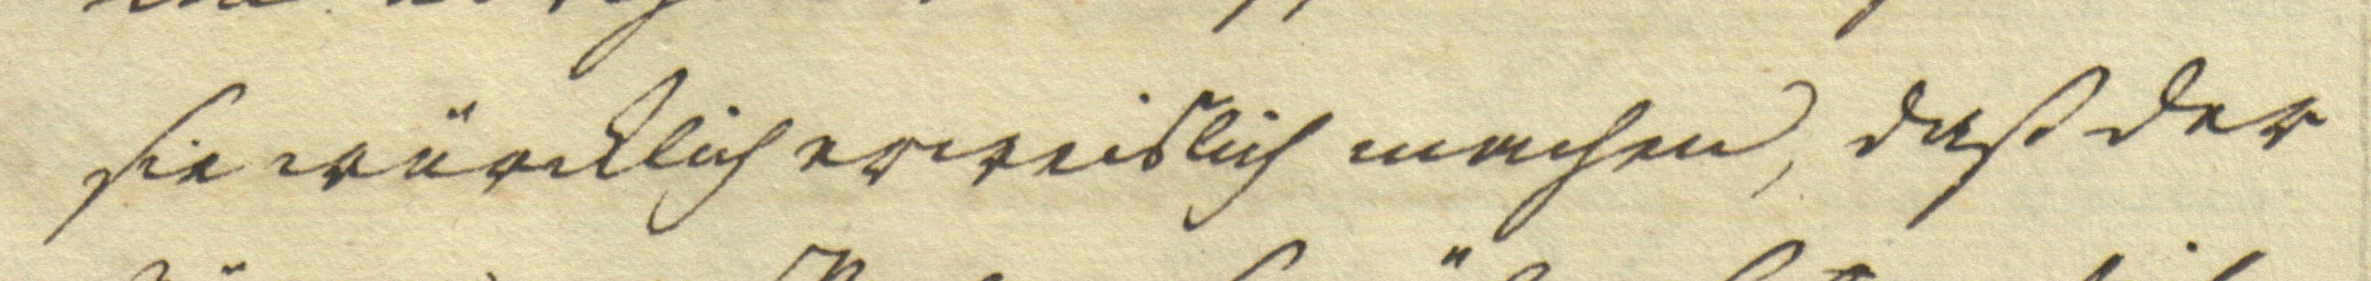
sie würcklich erweislich machen, daß der
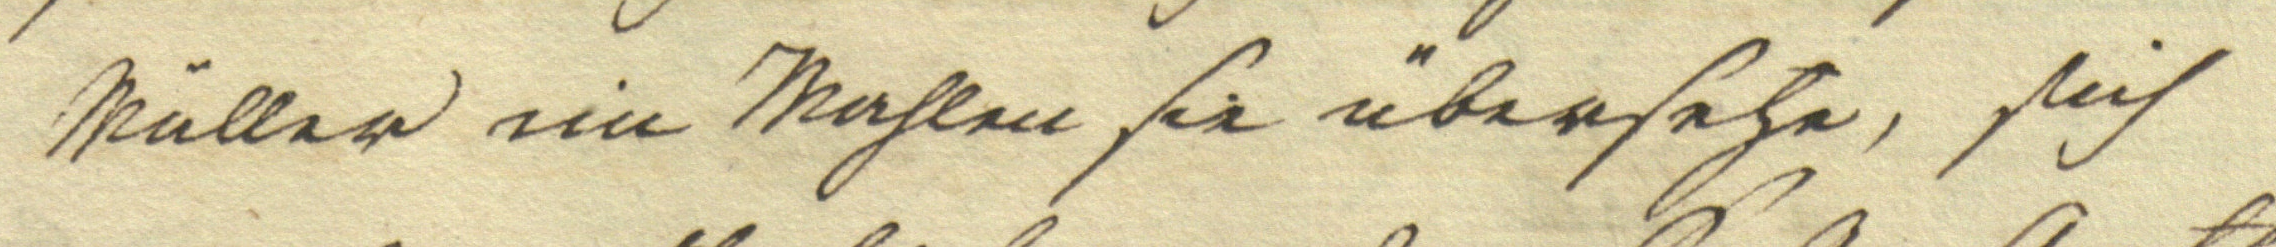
Müller im Mahlen sie übersetze, sich
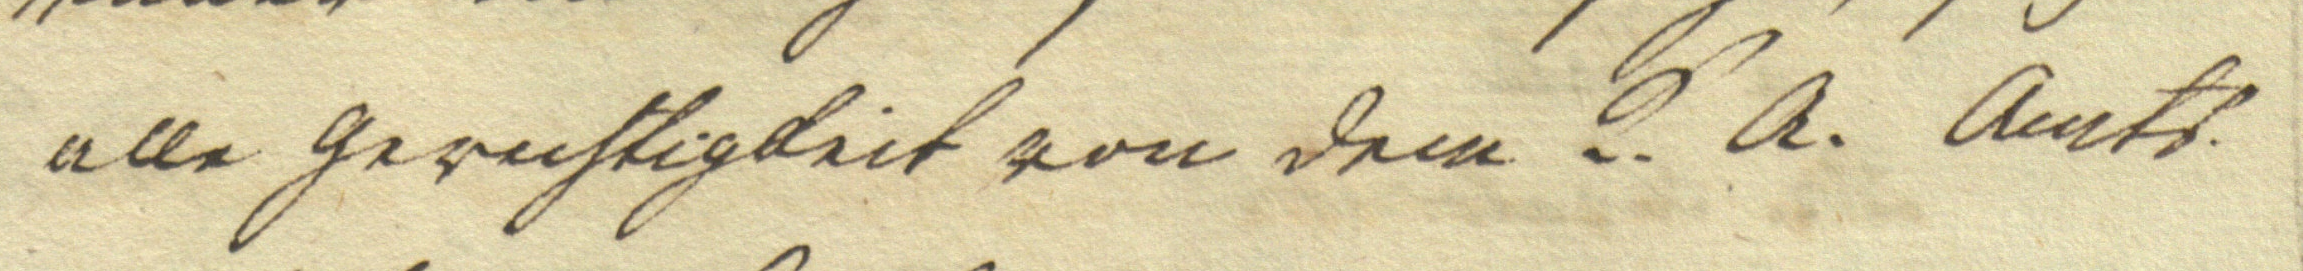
alle Gerechtigkeit von dem K. A. Amts¬
